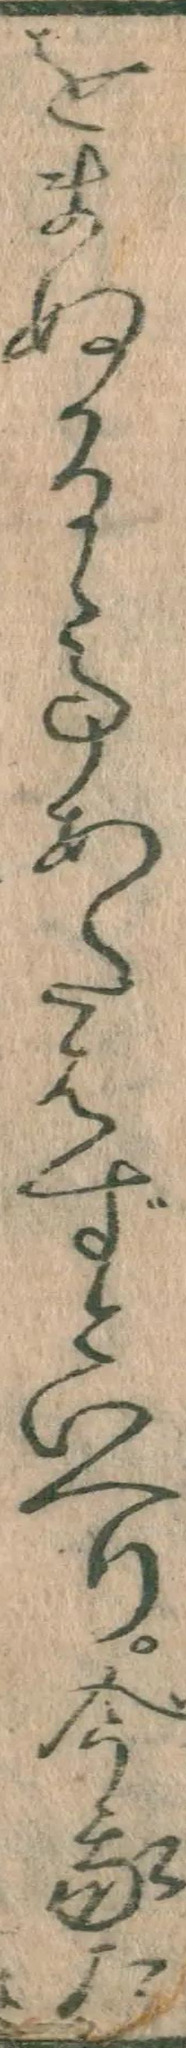をまぬかるゝ事あたはずといへり。今我た
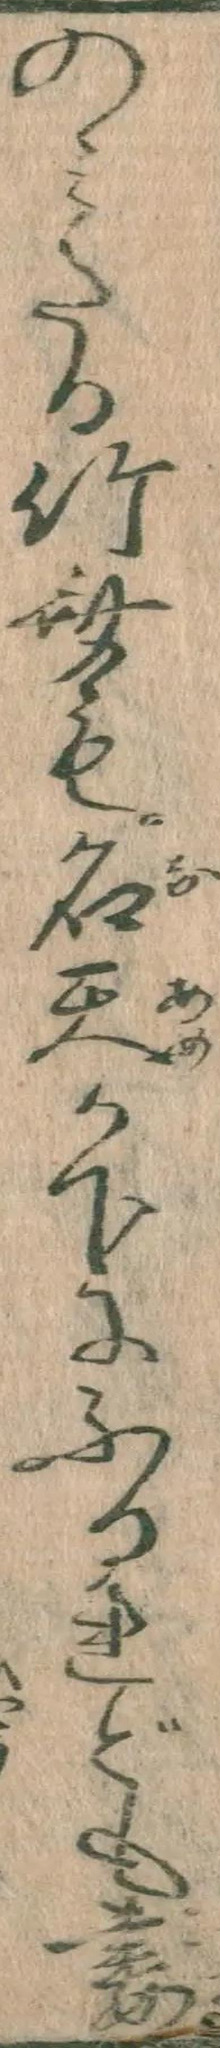のみたる竹斎も。名天か下にふりけれども妻
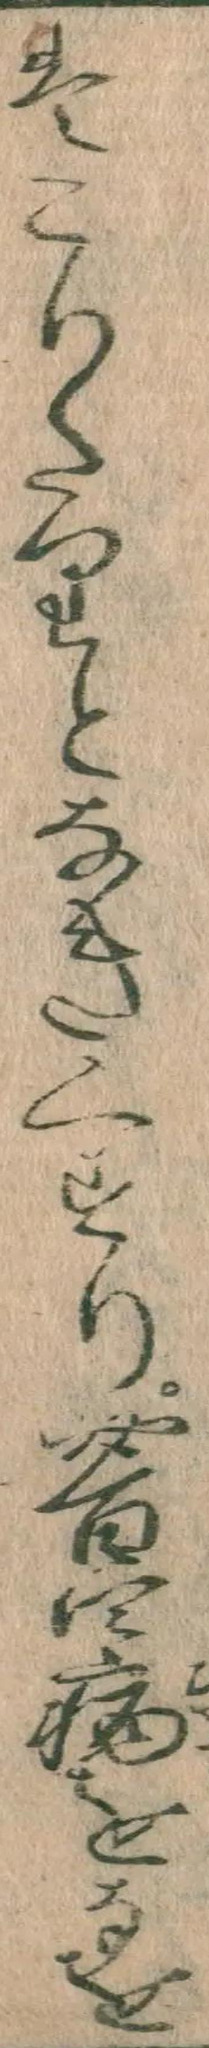はこりたりとなきくすり。四百四病をなを
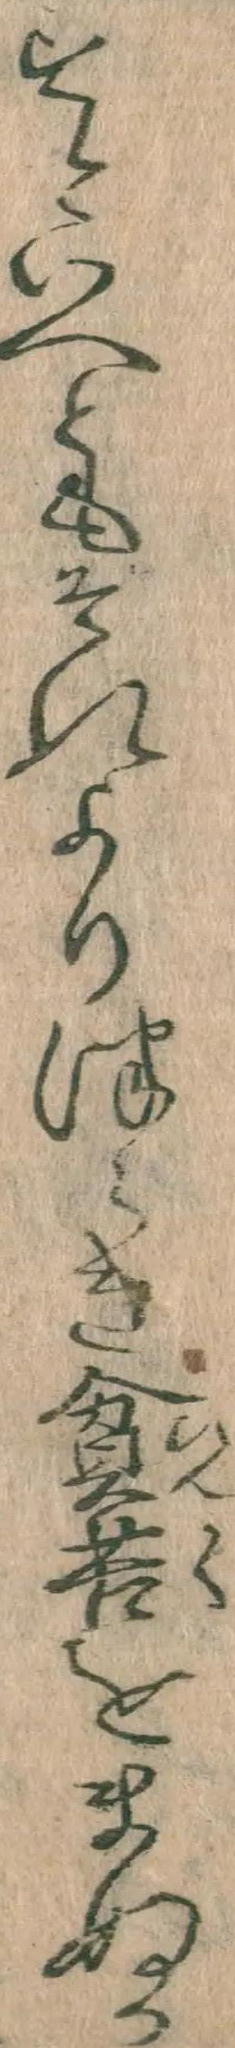すといへとも。それよりつらき貧苦をまぬか
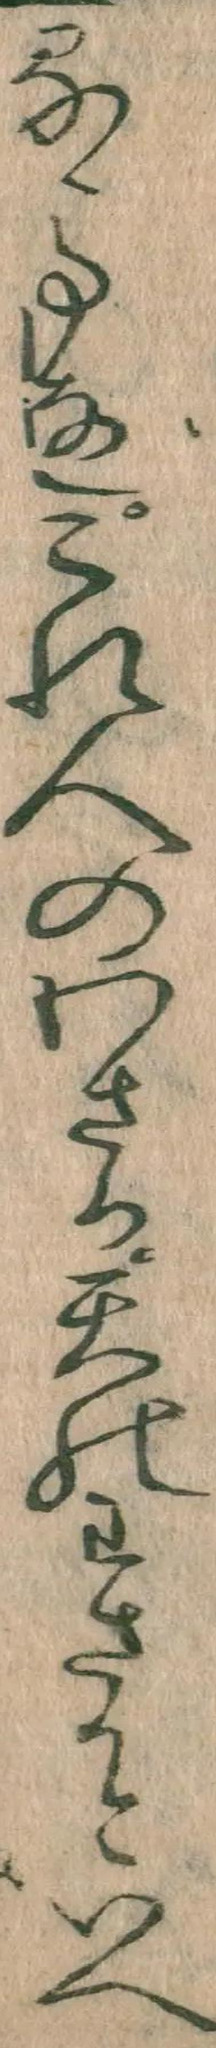るゝ事なし。これ人のわさか。天のわさかといへ
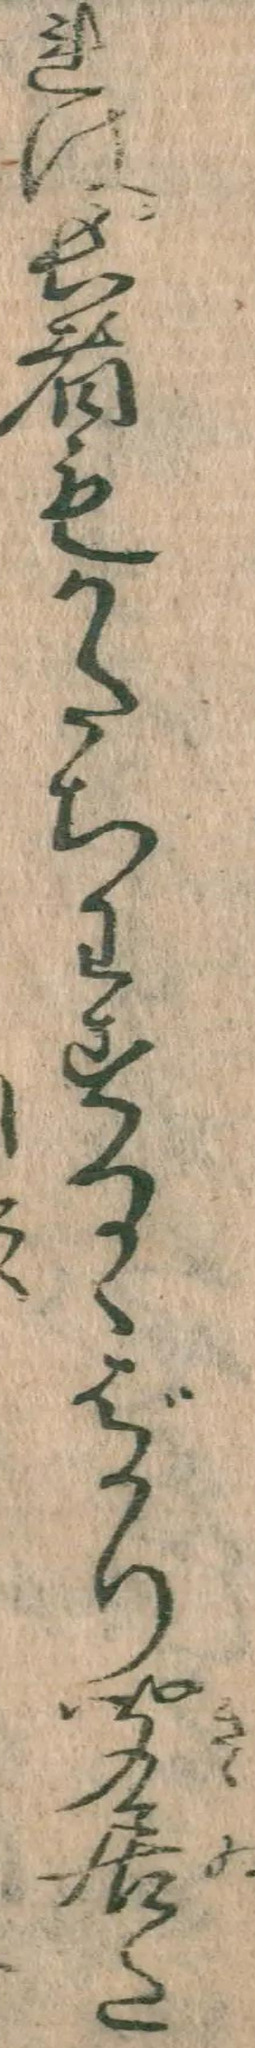れは。長者もかたちわするゝばかり聞居た
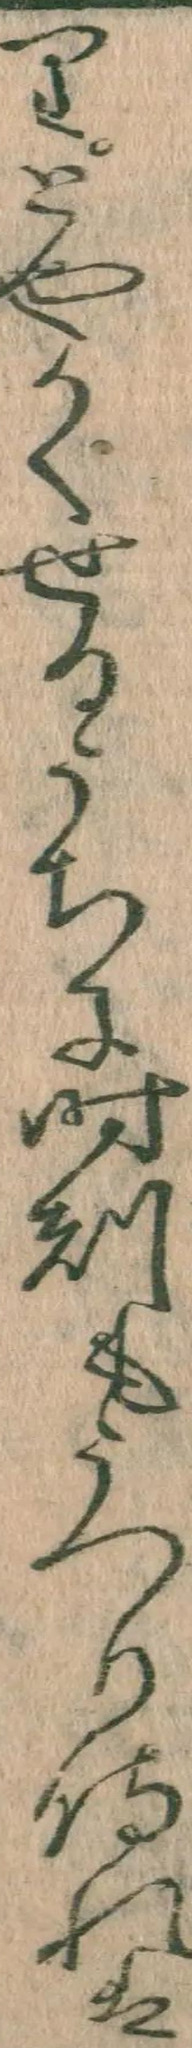り。とやかくせるうちに時刻もうつり侍れは
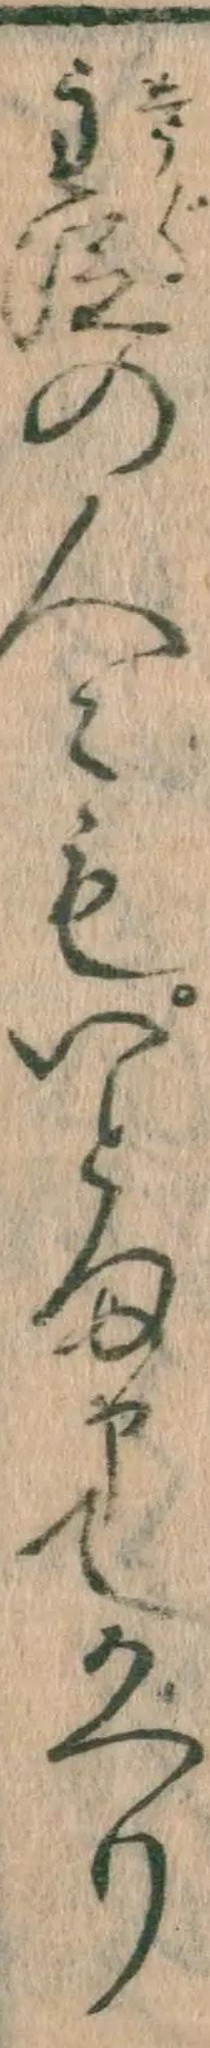主従の人々も。いとま申てかへり

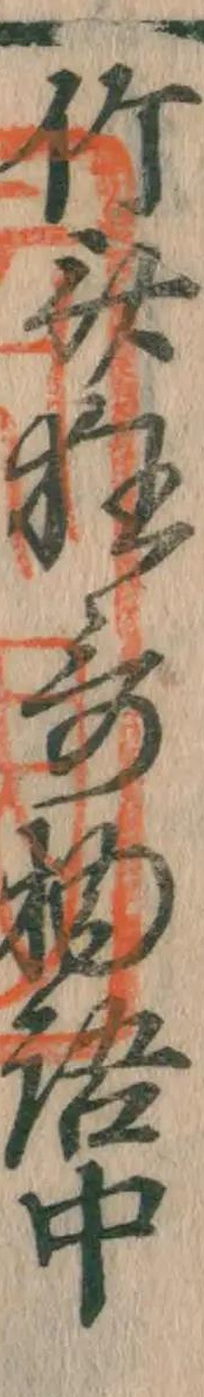竹斎狂哥物語中
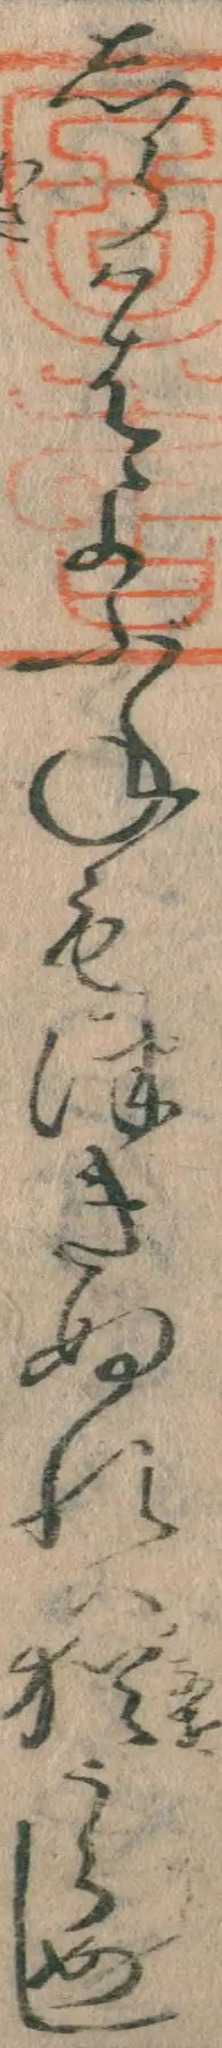しらかはよぶねもつきぬれは。猶うらめし
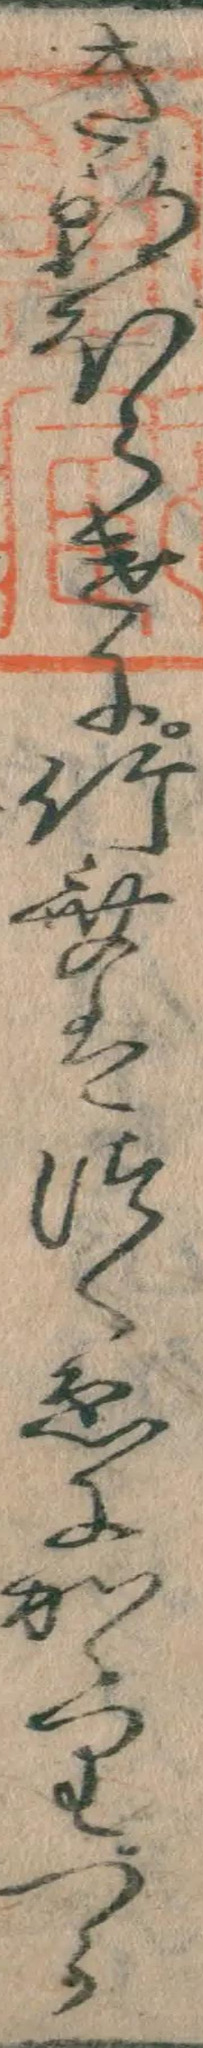き朝ぼらけに。竹斎はつくゑにかゝり。つら
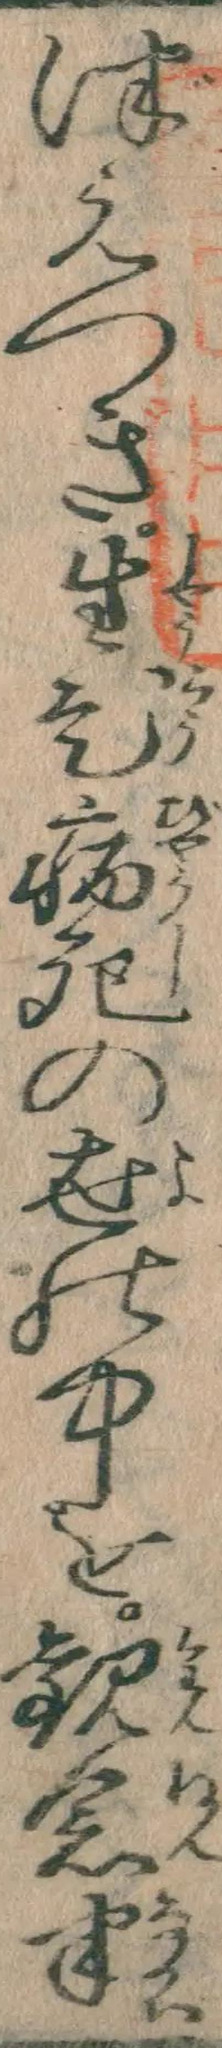づえつき。生老病死の世の中を。観念半
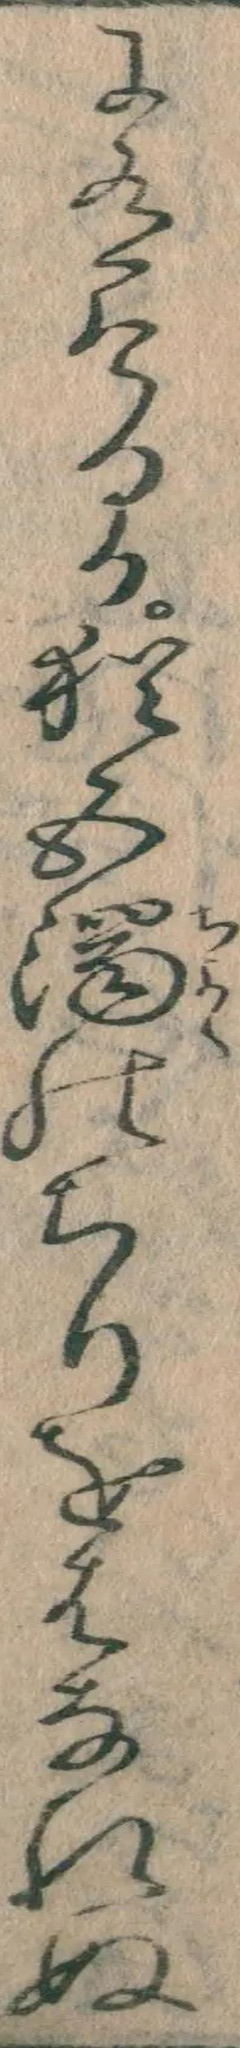に有けるか。猶五濁のちりをはなれぬ
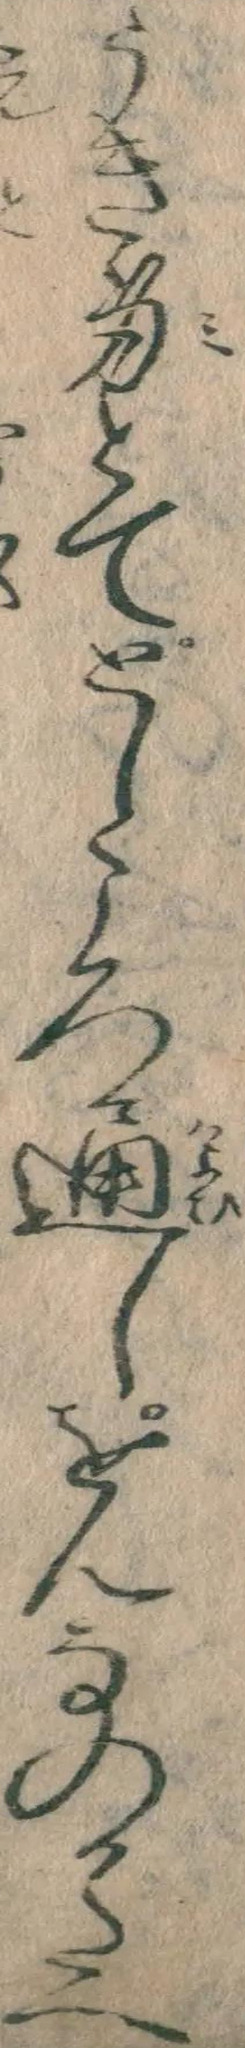うき身とて。としころ通し。をんなのかたへ
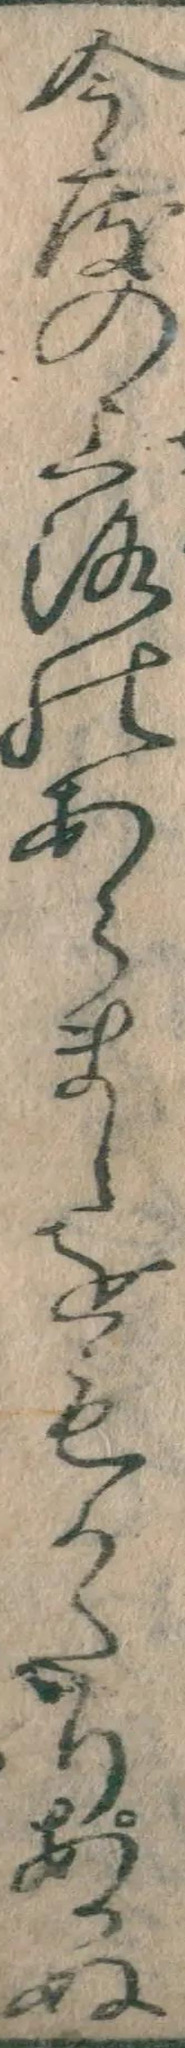今度の上洛のあらましをもかたり。あかぬ
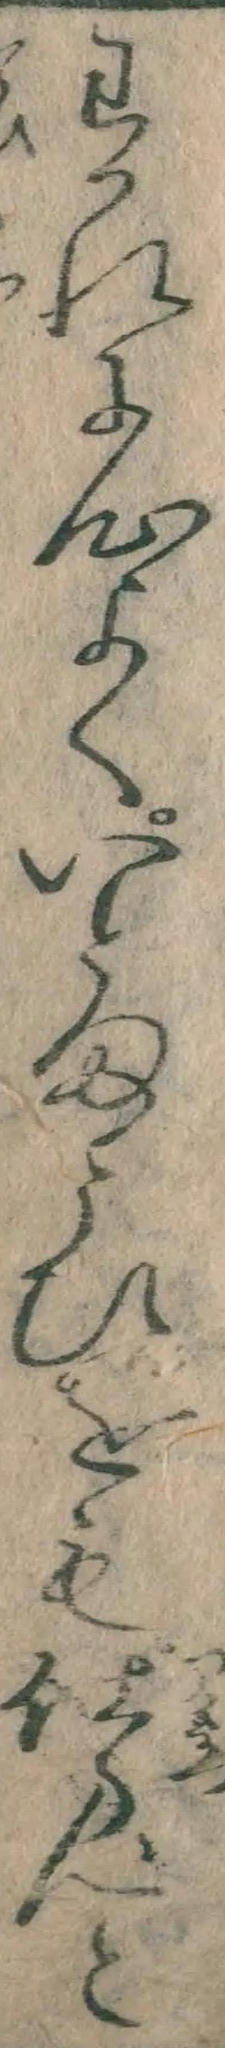わかれに心よく。いとまこひをも仕らんと
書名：竹斎狂歌物語 3巻
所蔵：国立国会図書館 National Diet Library, JAPAN
